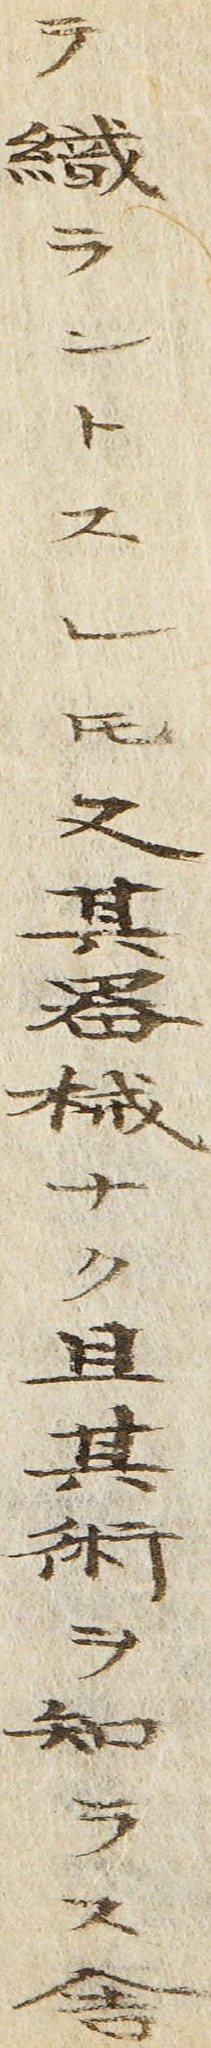テ織ラントスレトモ又其器械ナク且其術ヲ知ラス舎
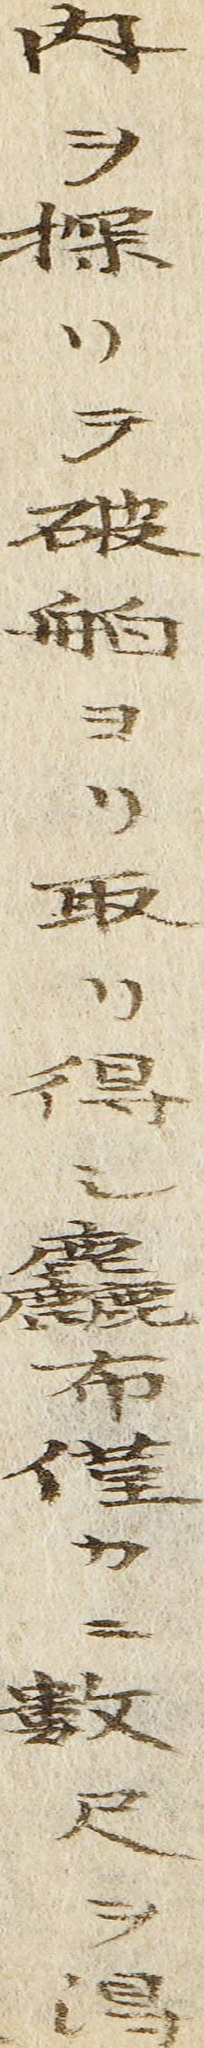内ヲ探リテ破舶ヨリ取リ得シ麤布僅カニ数尺ヲ得
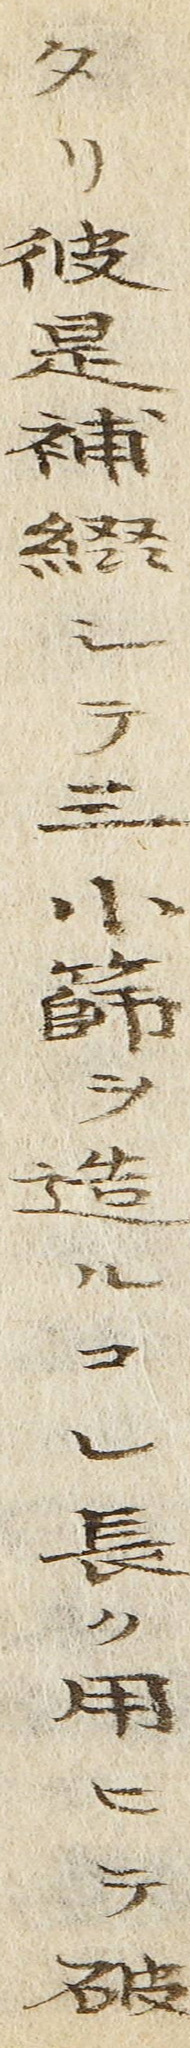タリ彼是補綴シテ三小篩ヲ造ルコレ長ク用ヒテ破
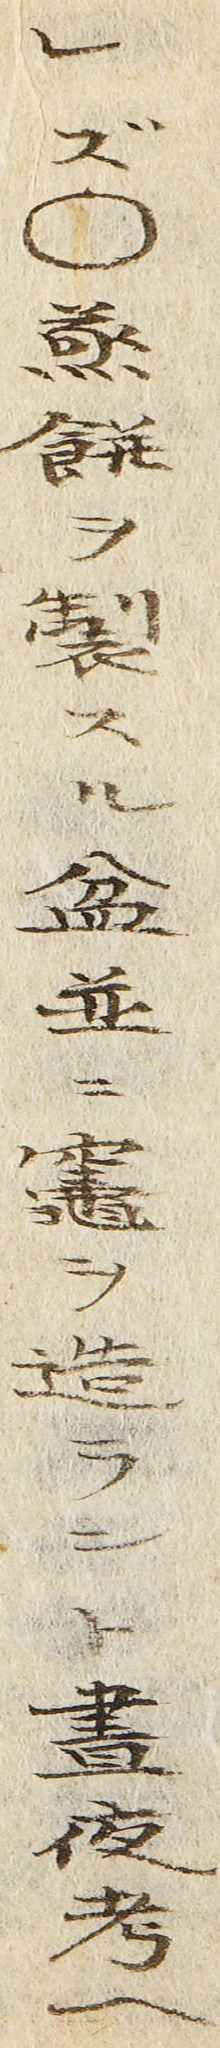レズ◯蒸餅ヲ製スル盆並ニ竈ヲ造ラント昼夜考ヘ
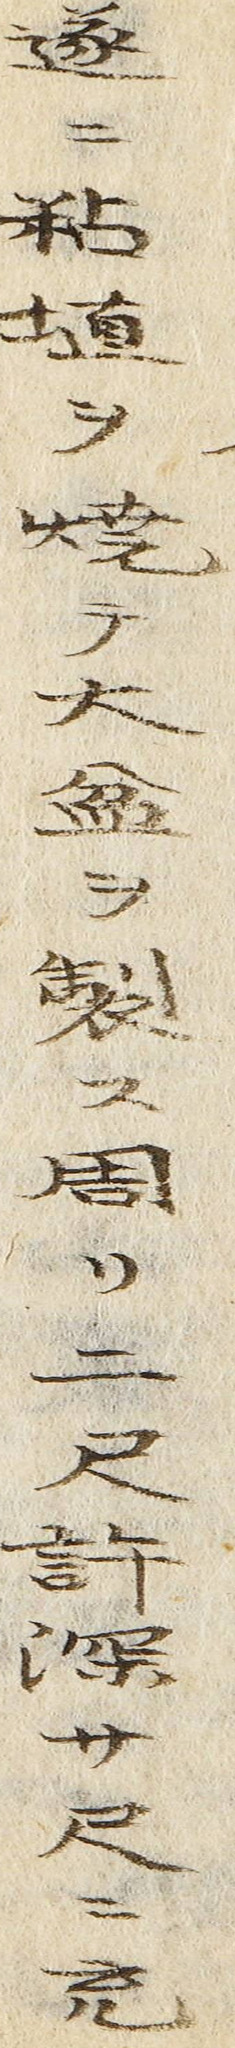遂ニ粘埴ヲ焼テ大盆ヲ製ス周リ二尺許深サ尺ニ充
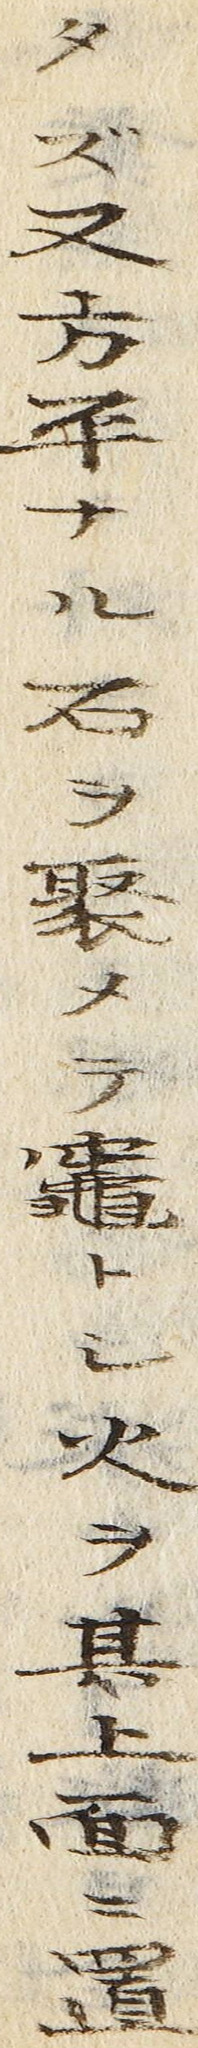タズ又方平ナル石ヲ聚メテ竈トシ火ヲ其上面ニ置
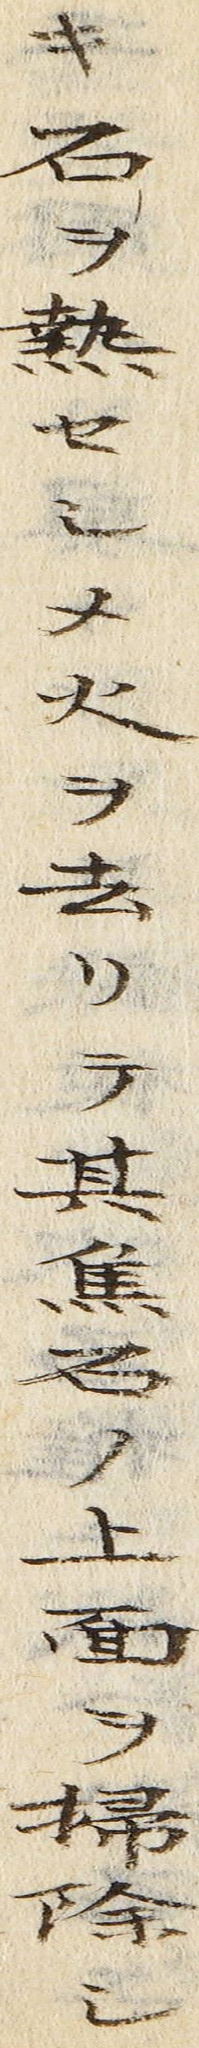キ石ヲ熱セシメ火ヲ去リテ其焦石ノ上面ヲ掃除シ
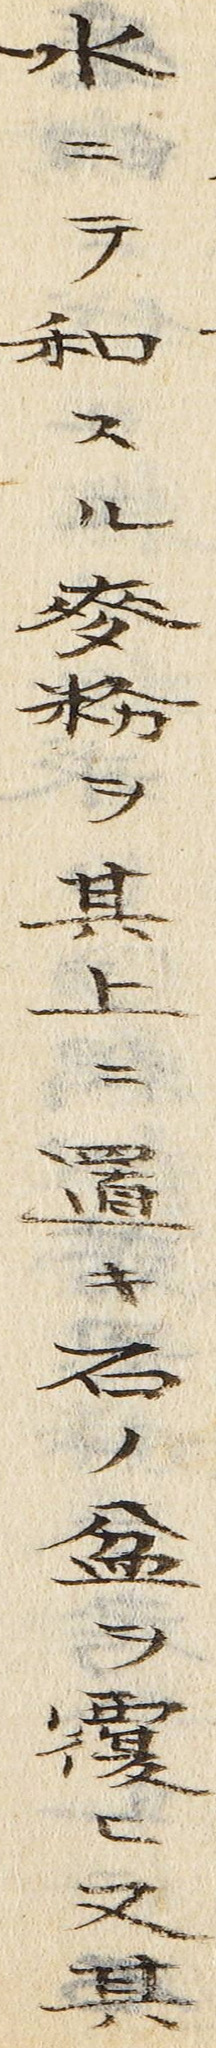水ニテ和スル麦粉ヲ其上ニ置キ石ノ盆ヲ覆ヒ又其
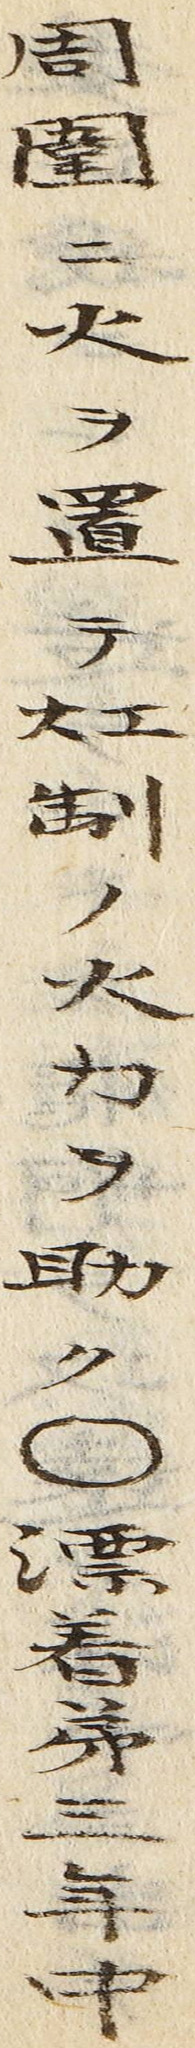周囲ニ火ヲ置テ灴制ノ火力ヲ助ク◯漂着第三年中
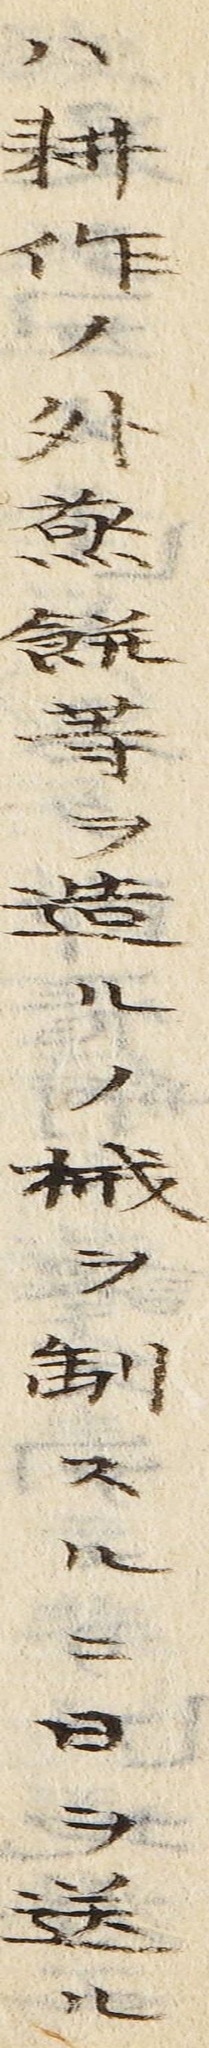ハ耕作ノ外蒸餅等ヲ造ルノ械ヲ制スルニ日ヲ送ル
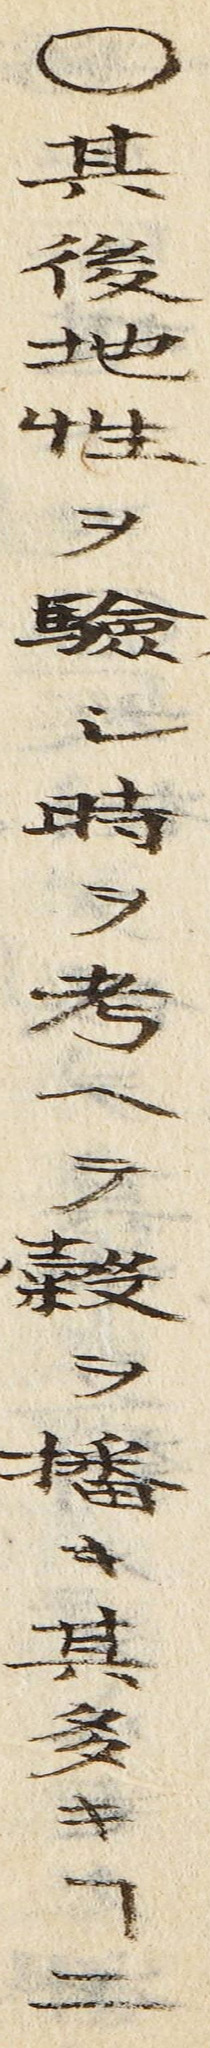◯其後地性ヲ験シ時ヲ考ヘテ穀ヲ播キ其多キコト二
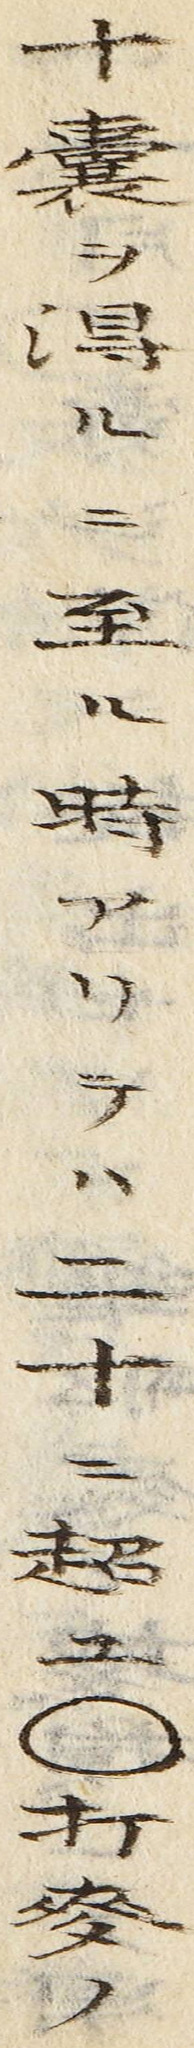十嚢ヲ得ルニ至ル時アリテハ二十ニ超ユ◯打麦ノ
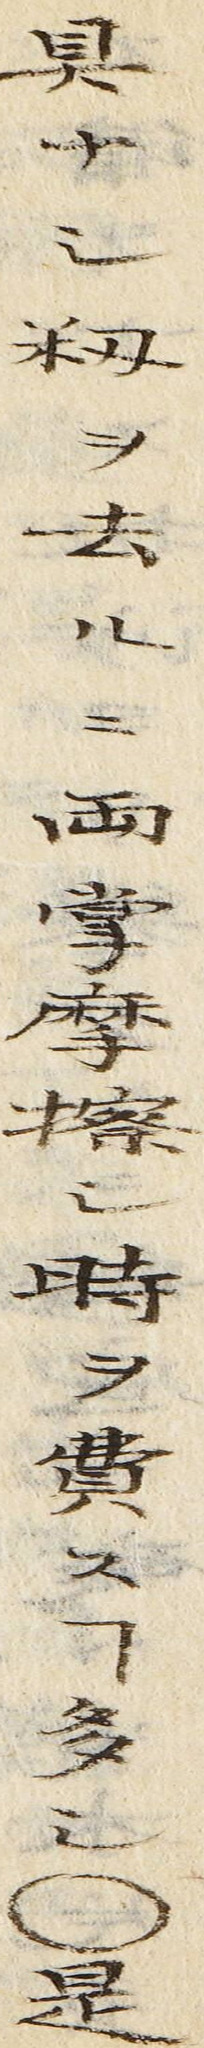具ナシ籾ヲ去ルニ両掌摩擦シ時ヲ費スコト多シ◯是
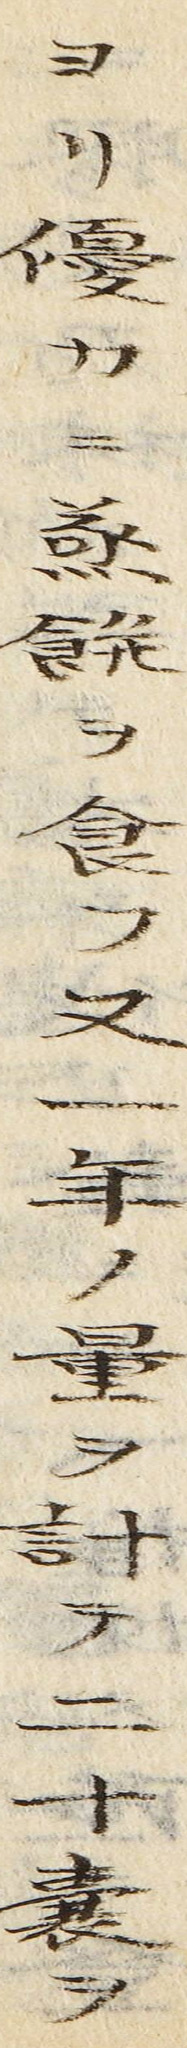ヨリ優カニ蒸餅ヲ食フ又一年ノ量ヲ計テ二十嚢ヲ
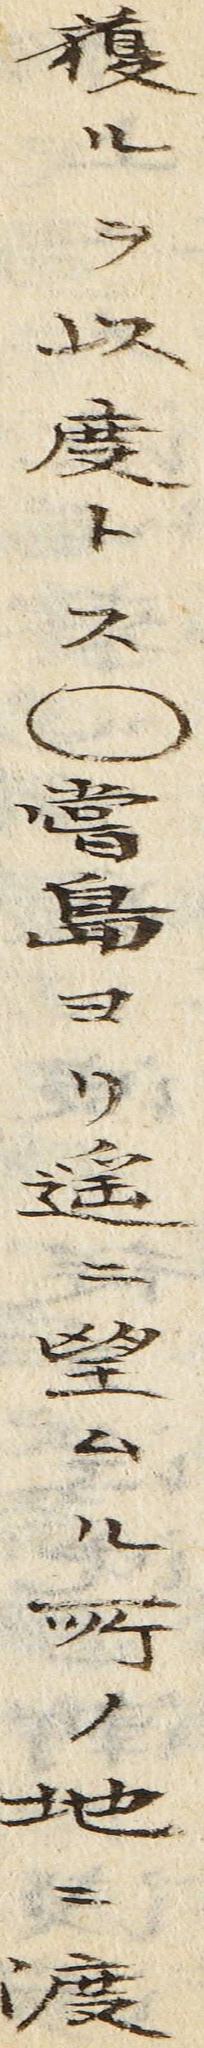獲ルヲ以度トス◯嘗島ヨリ遥ニ望ムル所ノ地ニ渡
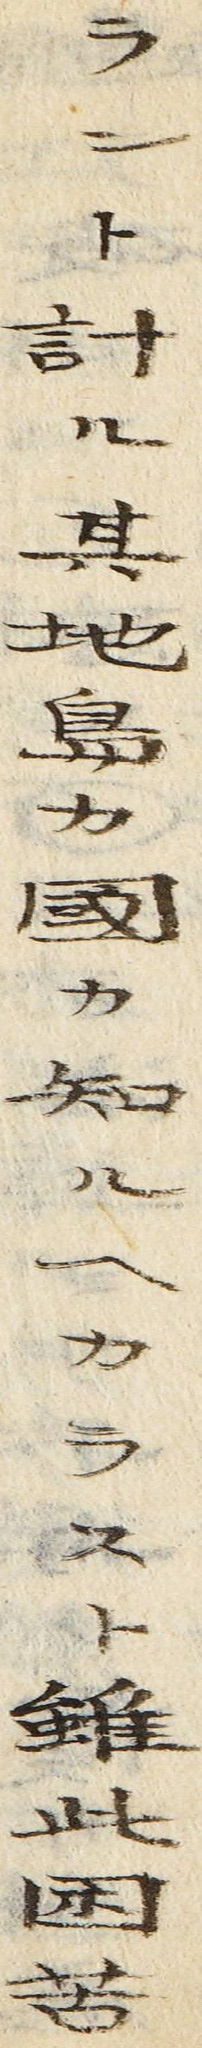ラント計ル其地島カ国カ知ルヘカラスト雖此困苦
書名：漂流紀事
